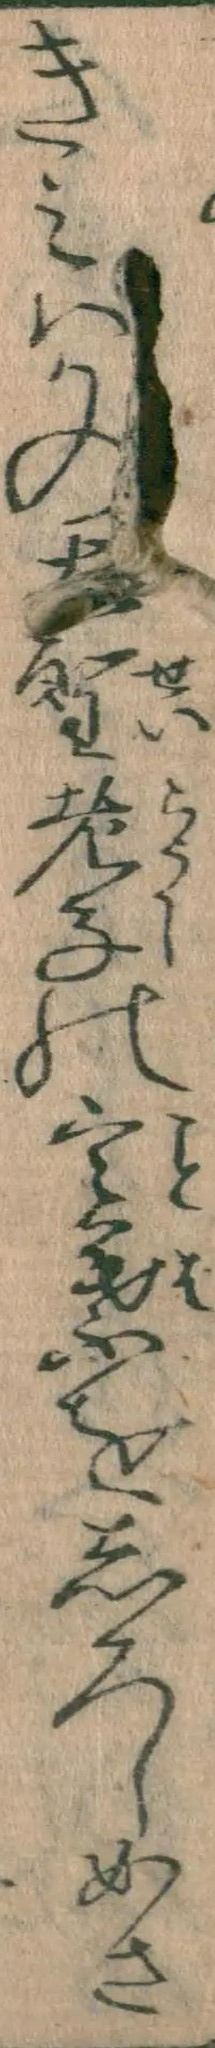きみはかの聖老子の言葉をしろしめさ
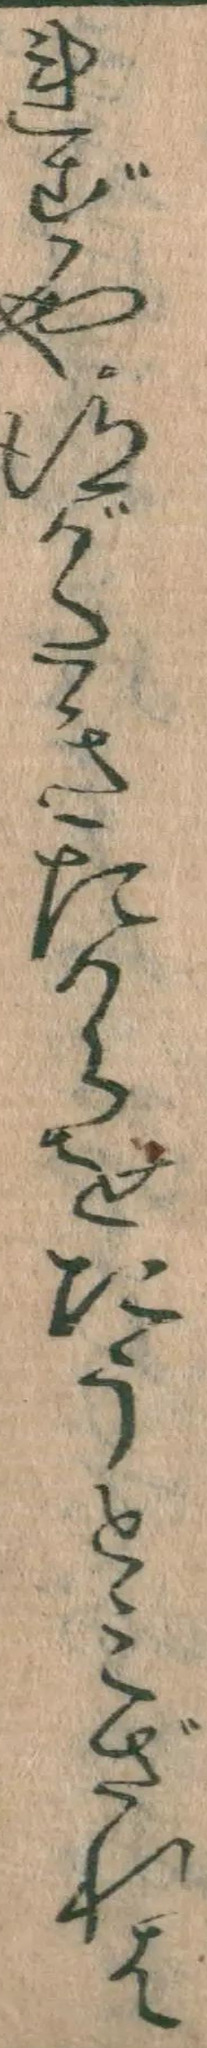れずや。得がたきたからをたうとみざれは
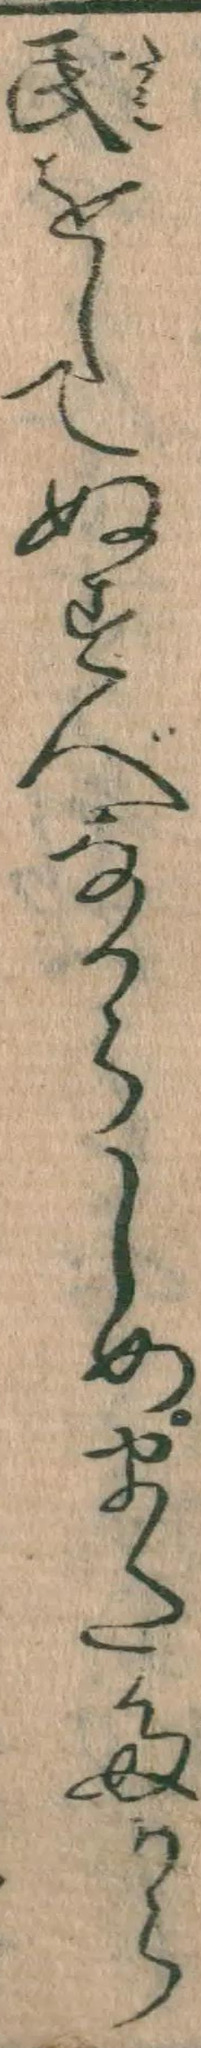民をしてぬす人なからしめ。またたから
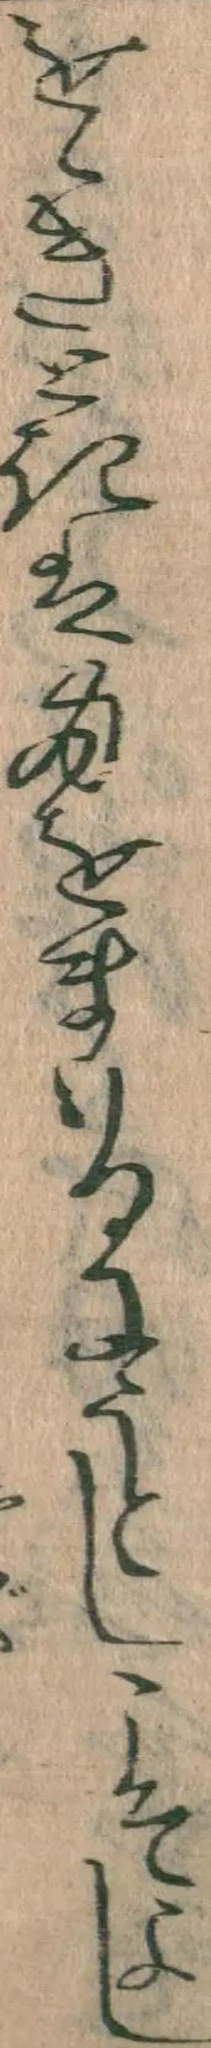をゝきときは身をまいるにうとしこそ。よし
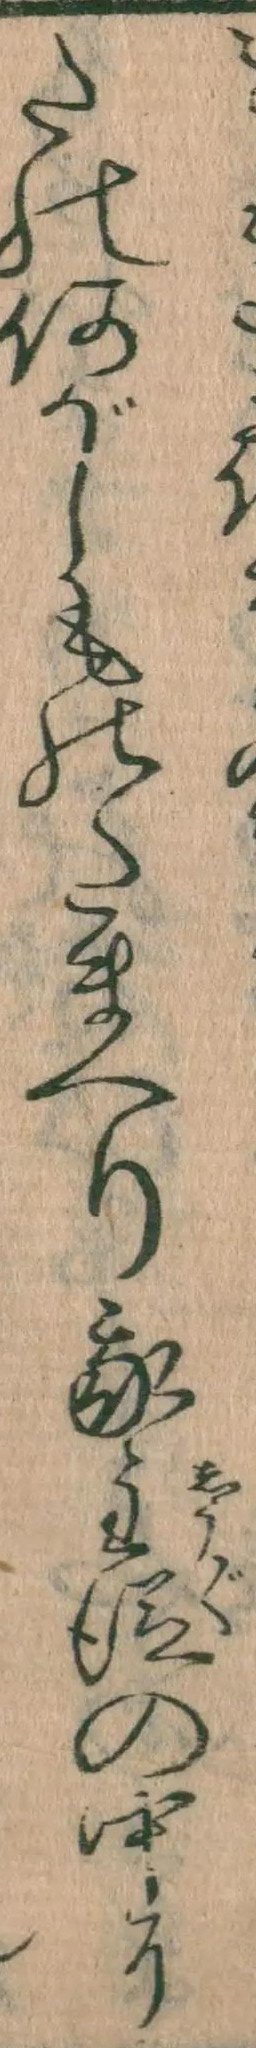たの何がしものたまへり我主従の中に
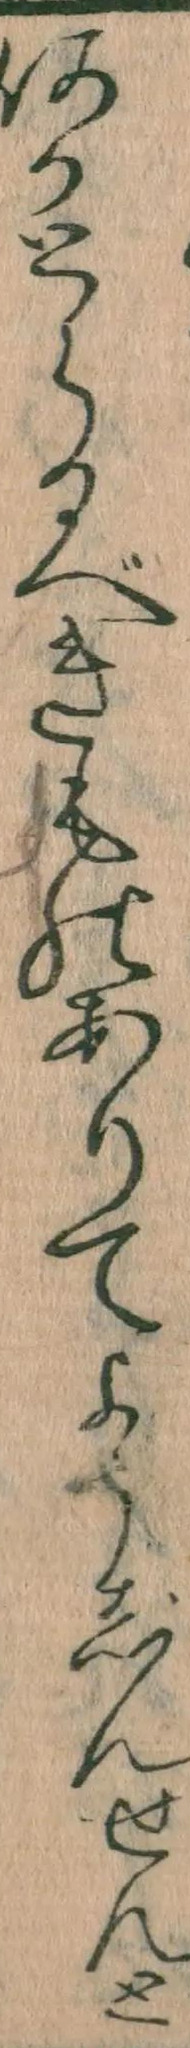ありとらるべきものありてようしんせんと
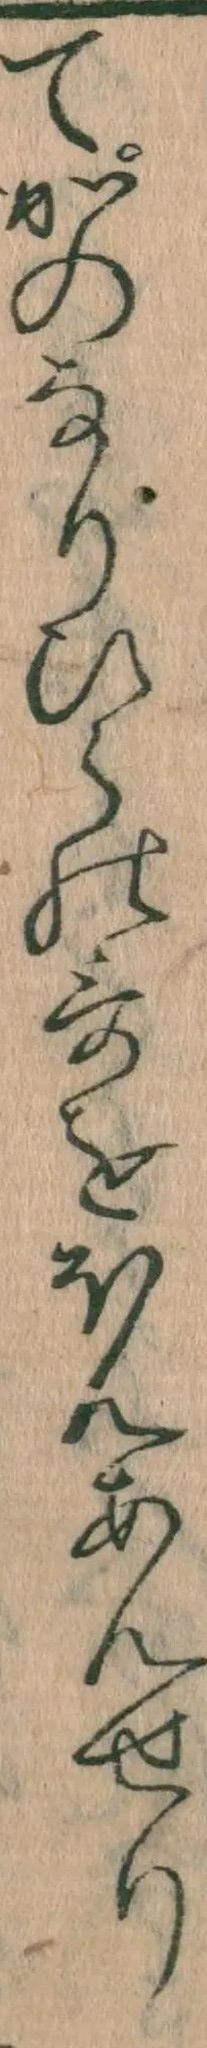て。かのなりひらの哥をほんあんせり
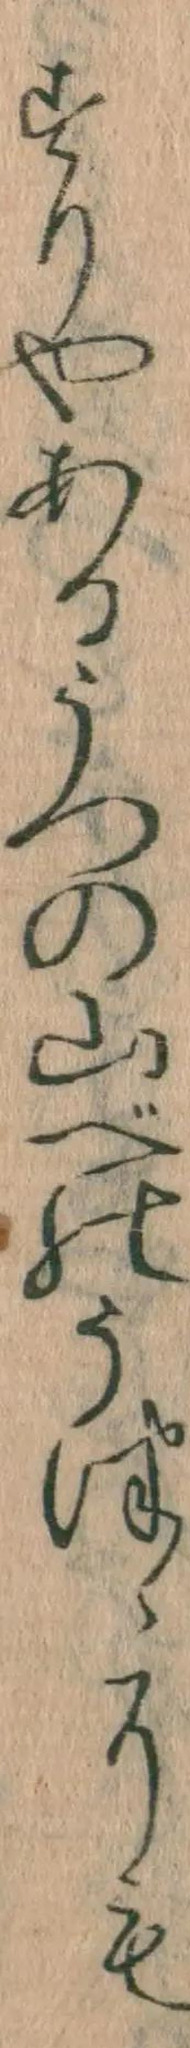すりやあるうつの山べのうつゝにも
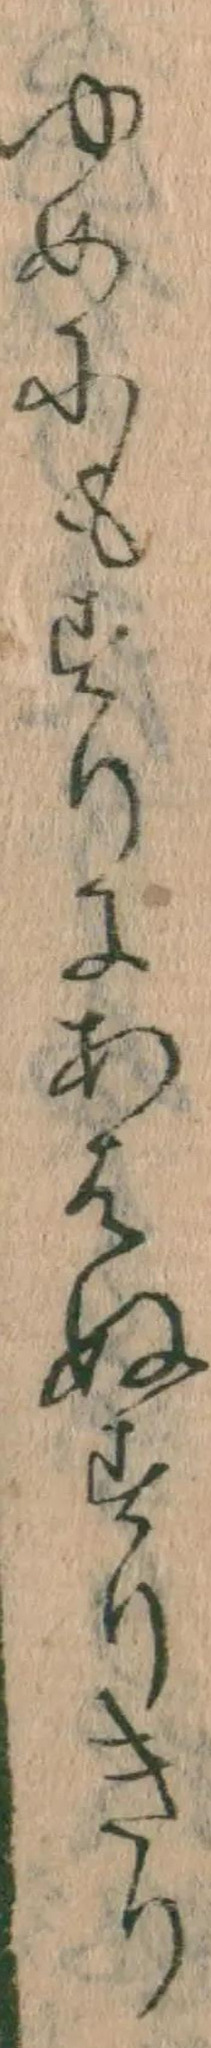ゆめにもすりにあはぬすりきり

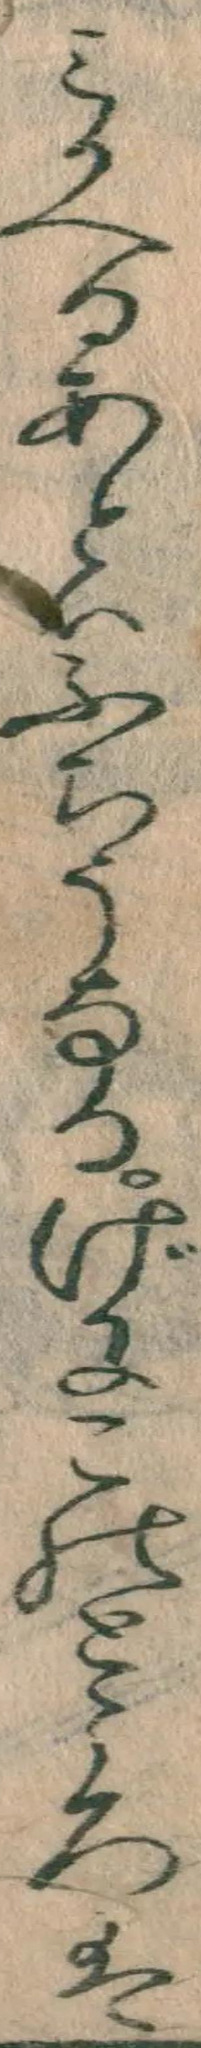みかへるあとはふちうなる。げにこのところは
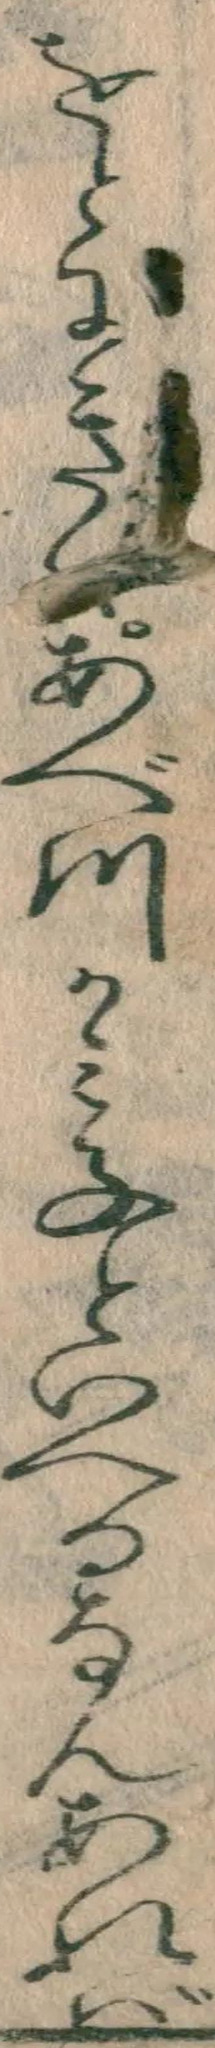をとにきく。あべ川かみ子といへるなんあれば
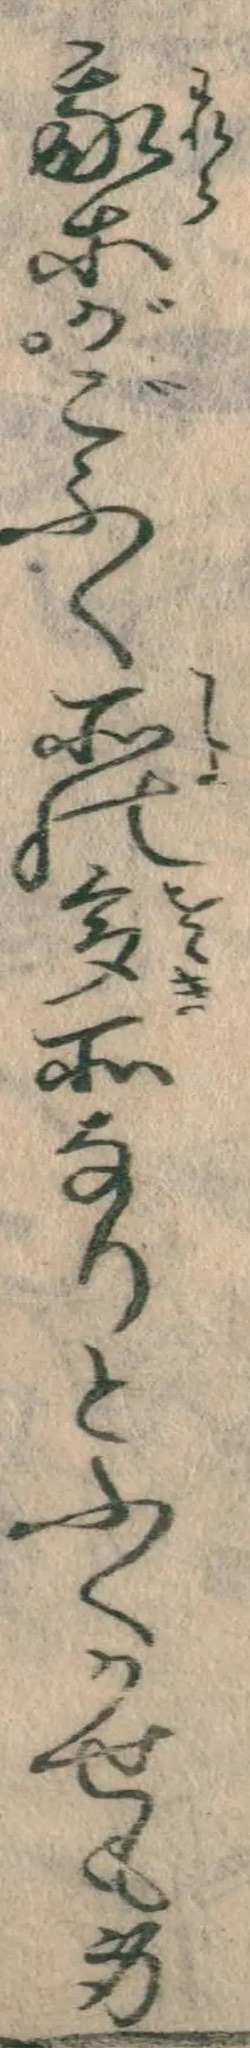我等が。ごふく所の多所なりとふくかせも身
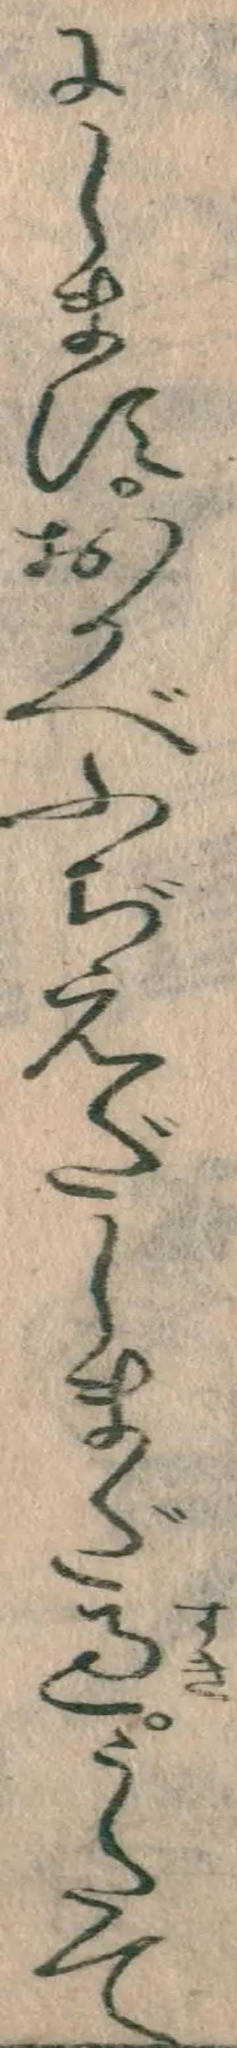にします。おかべふぢえだしまだ過。うたて
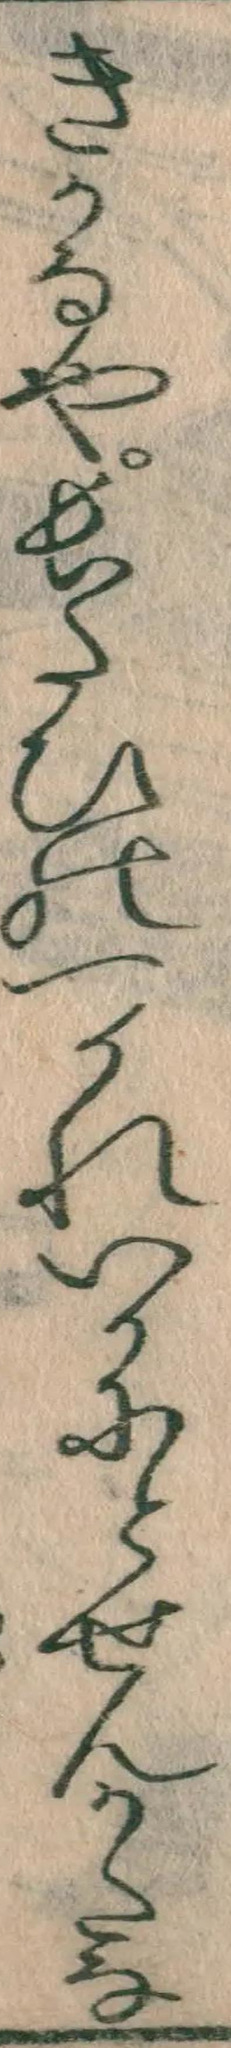きかなや。長たひのつかれいかにとせんかたな
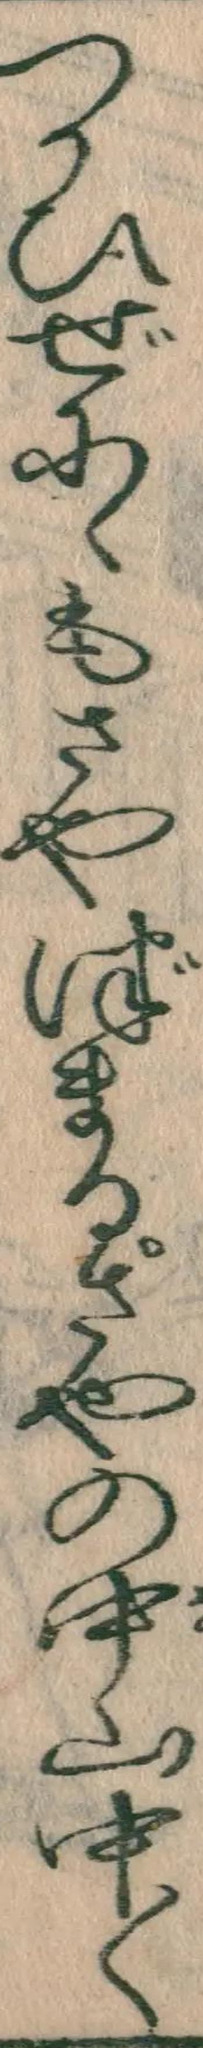つかひぜにゝもさやづまる。さやの中山中〳〵
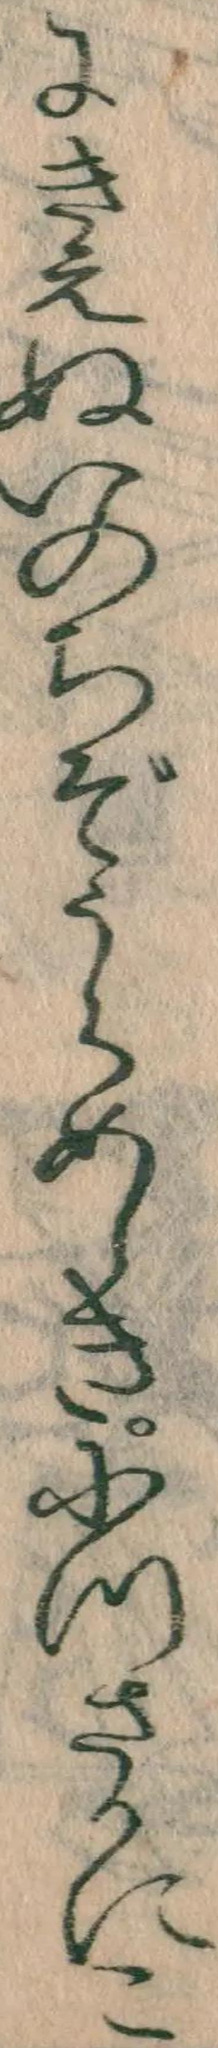にきえぬいのちぞうらめしき。小川さかにこ
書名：竹斎狂歌物語 3巻
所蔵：国立国会図書館 National Diet Library, JAPAN
